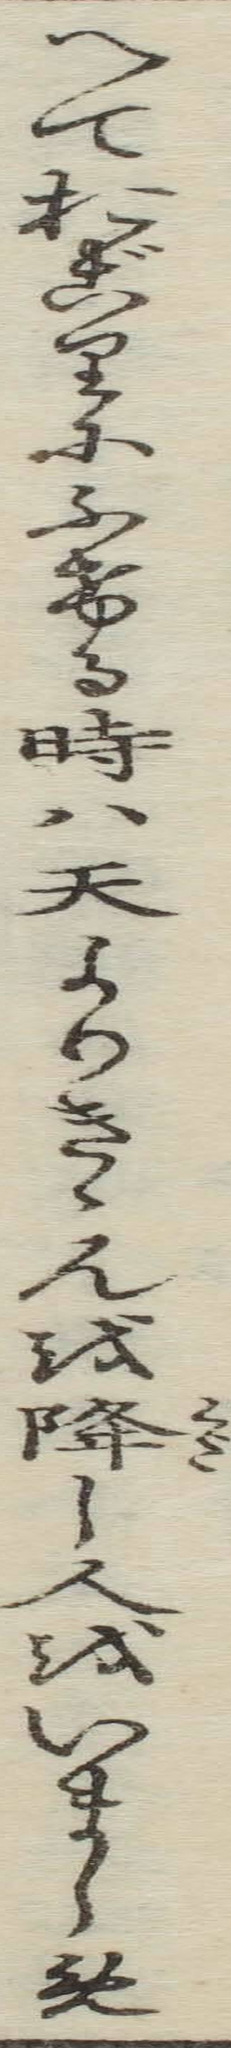へておごりにふける時は天よりきゝんを降し人をいましめ
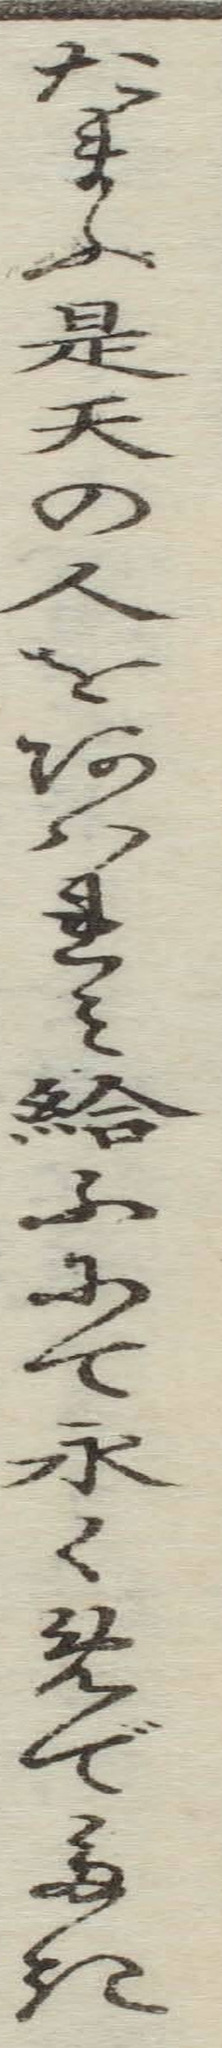たまふ是天の人をあはれみ給ふにて永くめでたき
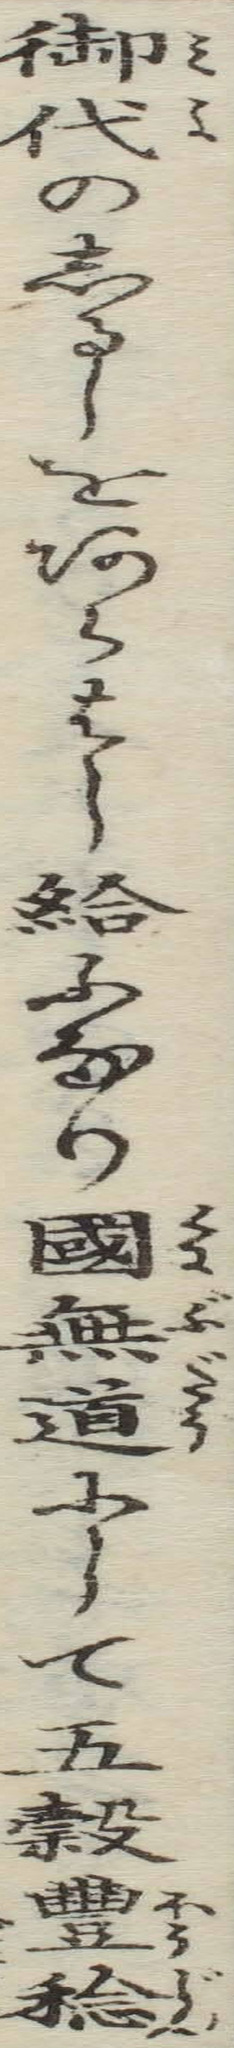御代のしるしをあらはし給ふなり国無道にして五穀豊稔
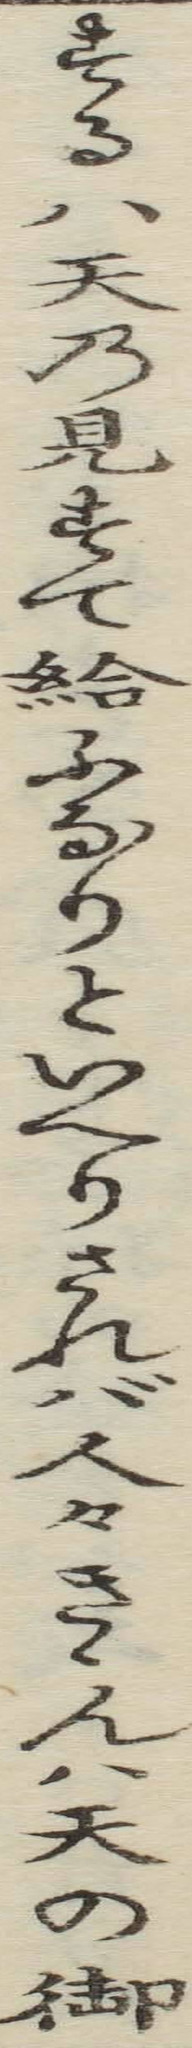するは天の見すて給ふなりといへりされば人々きゝんは天の御
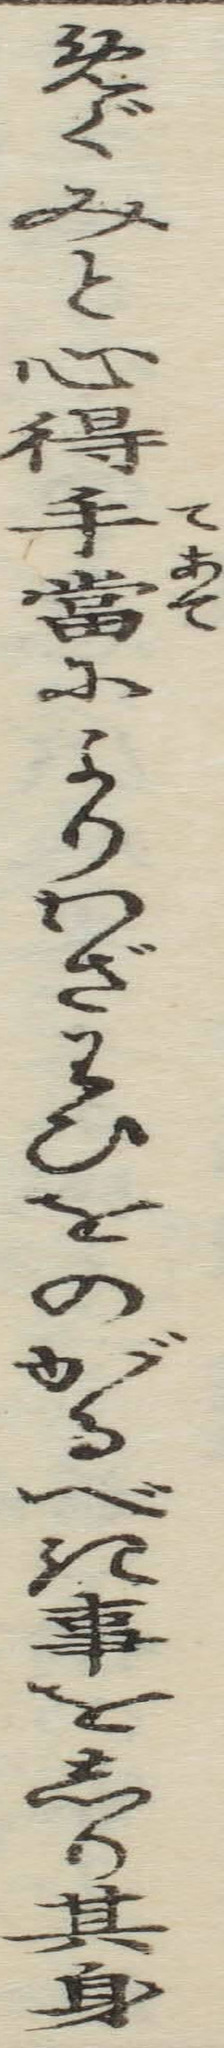めぐみと心得手当によりわざわひをのがるべき事をしり其身
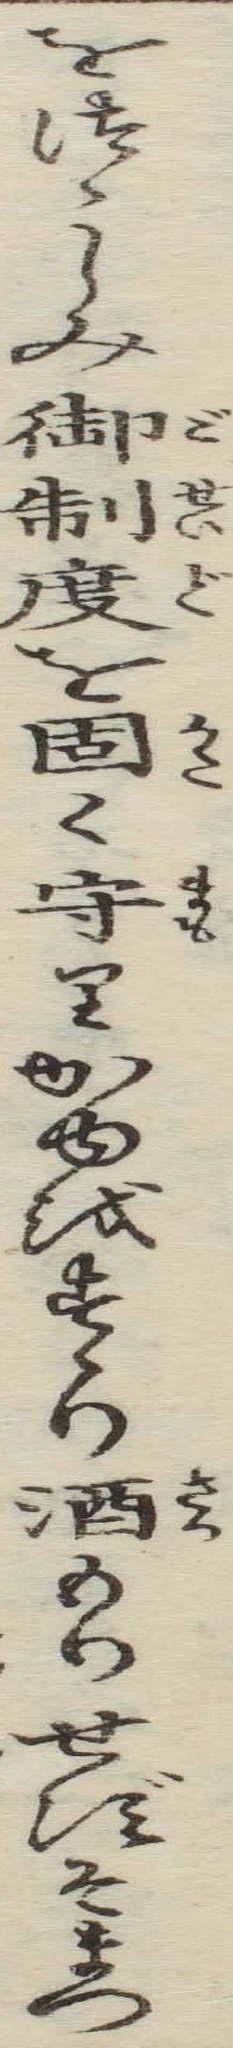をつゝしみ御制度を固く守りかゆをすゝり酒もりせずそまつ
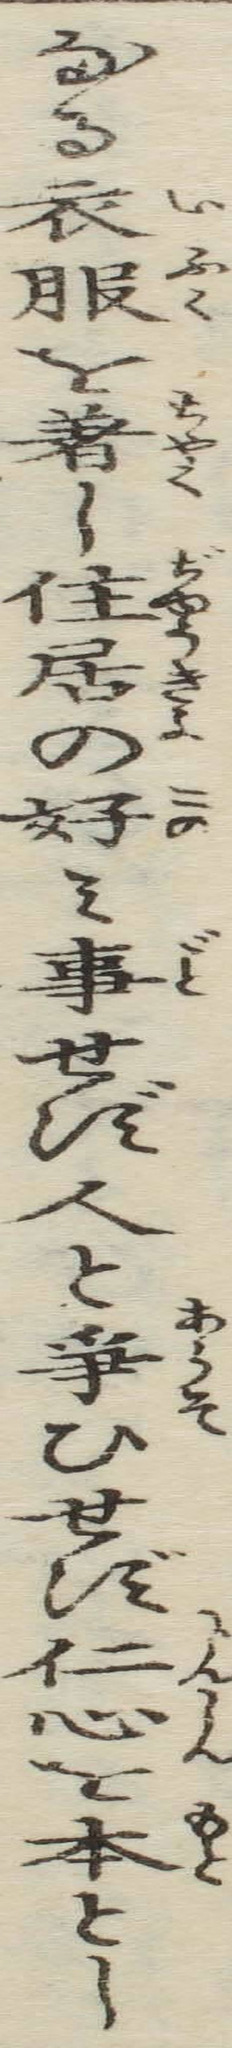なる衣服を着し住居の好み事せず人と争ひせず仁心を本とし
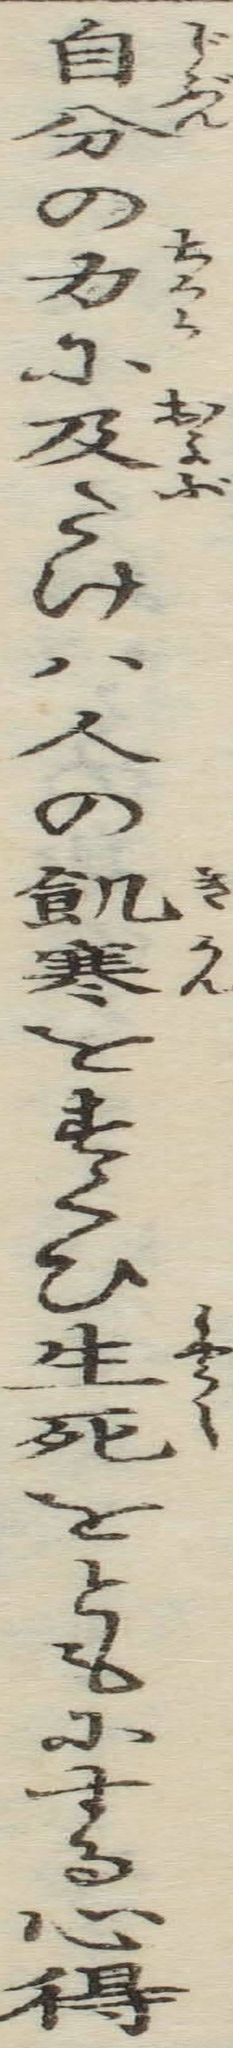自分の力に及たけは人の飢寒をすくひ生死をともにする心得
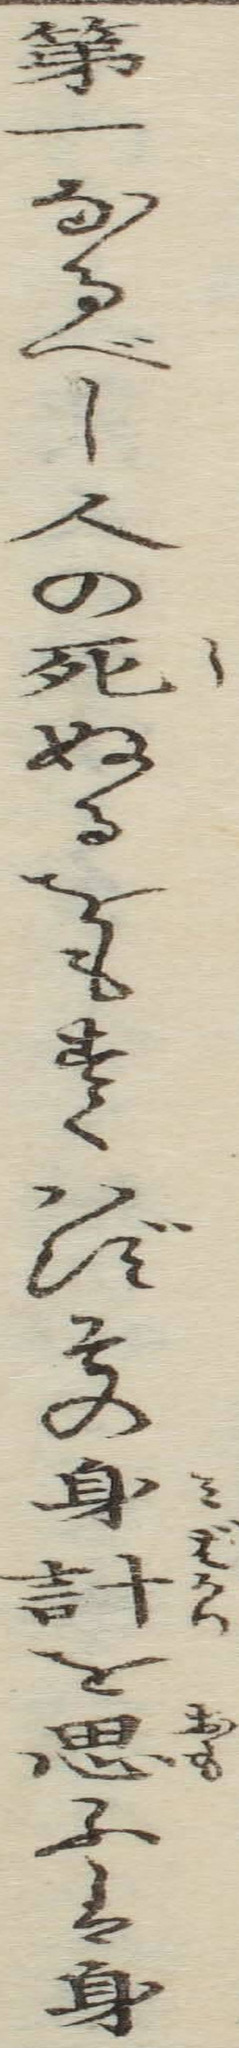第一なるべし人の死ぬるをもすくはずその身計を思ふは身
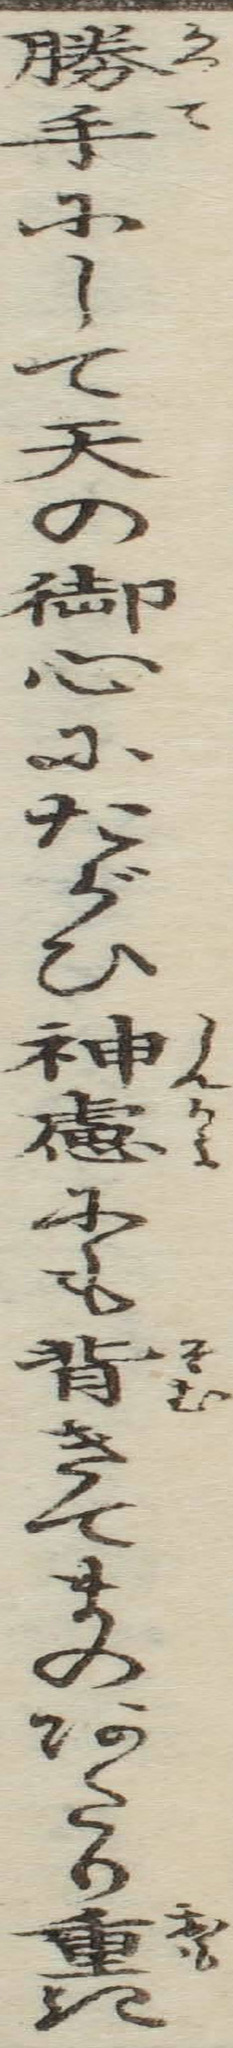勝手にして天の御心にたがひ神慮にも背きてまのあたり重き

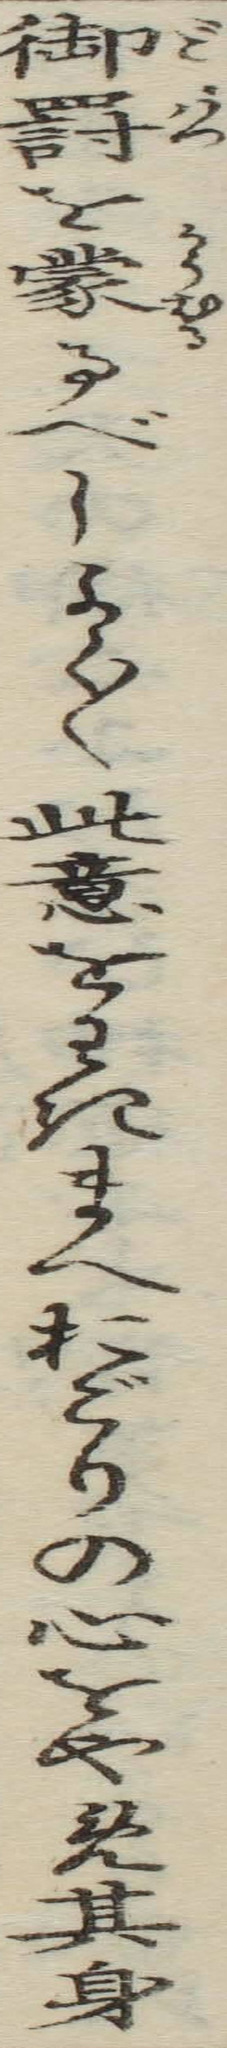御罰を蒙るべしよく〳〵此意をわきまへおごりの心をやめ其身
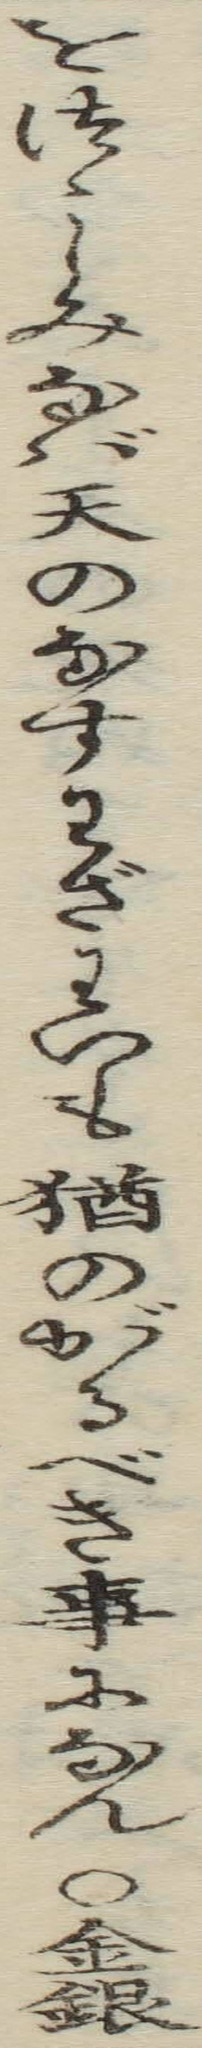をつゝしみなば天のなすわざわいも猶のがるべき事になん○金銀
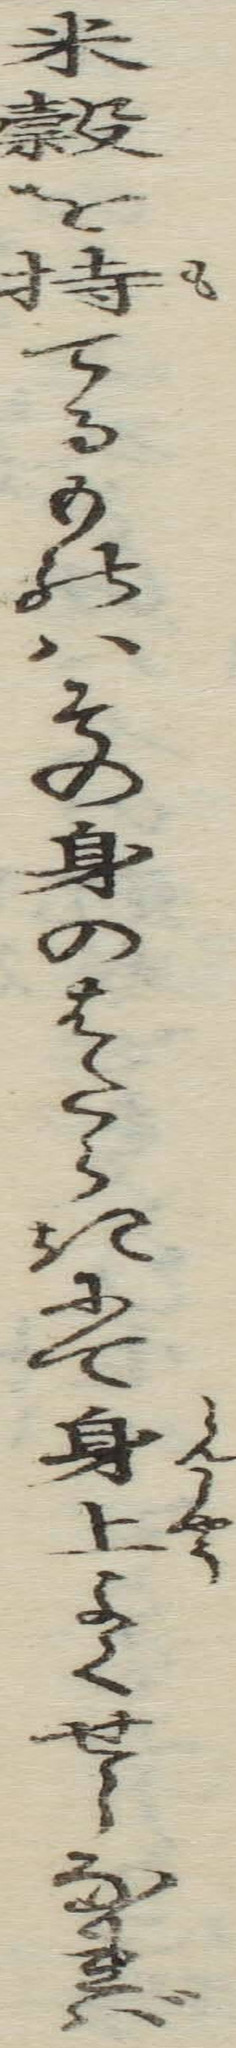米穀を持てるものはその身のはたらきにて身上よくせしなれば
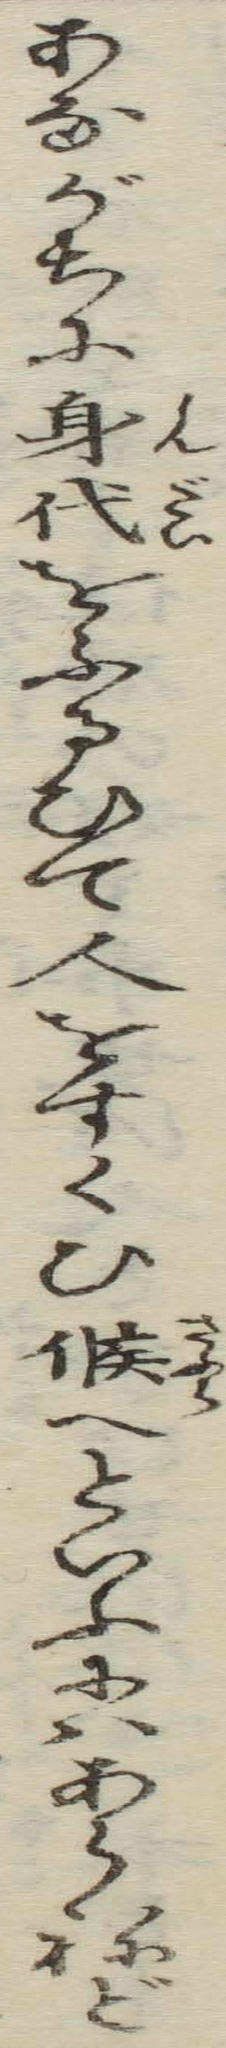あながちに身代をふるひて人をすくひ候へといふにはあらねど
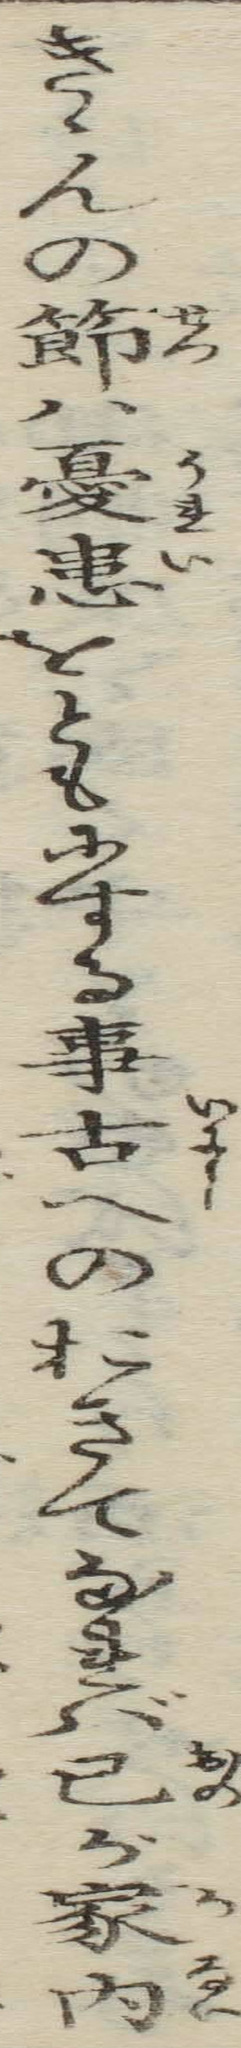きゝんの節は憂患をともにする事古へのおきてなれば己が家内
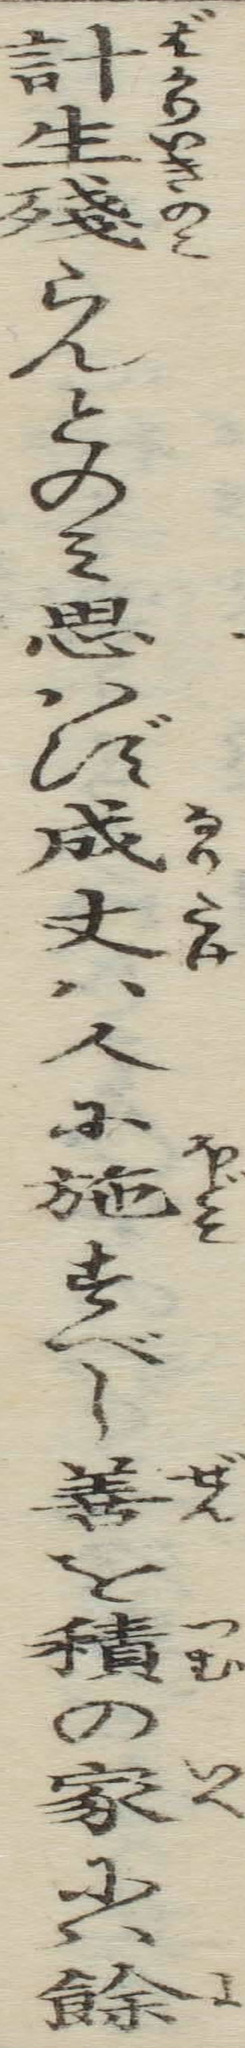計生残らんとのみ思はず成丈は人に施すべし善を積の家には余
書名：救荒便覧
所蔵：国文学研究資料館
